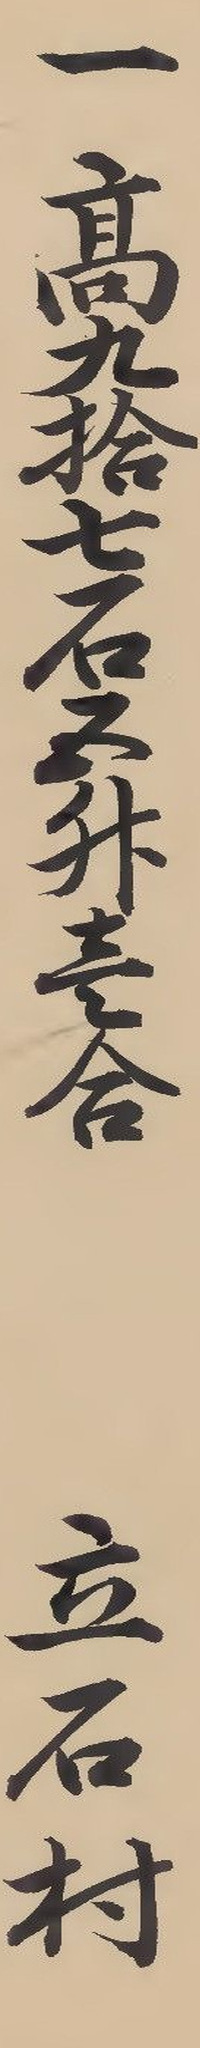一高九拾七石五升壱合立石村
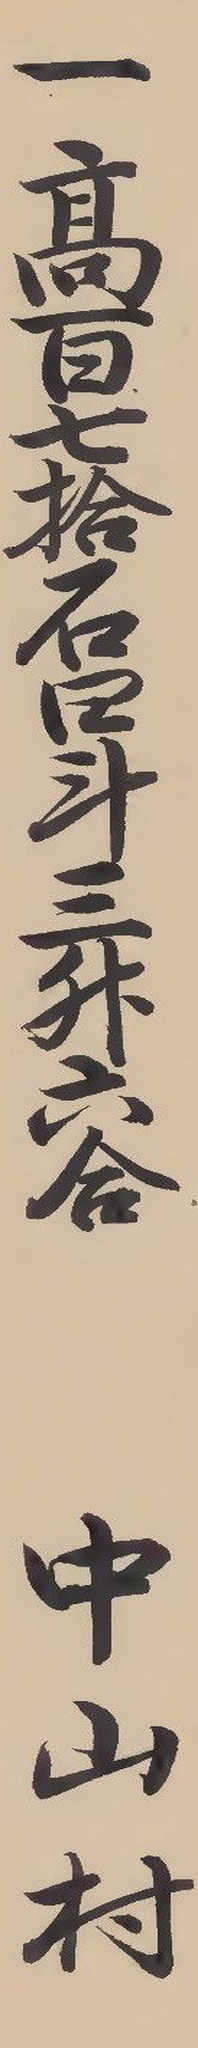一高百七拾石四斗三升六合中山村
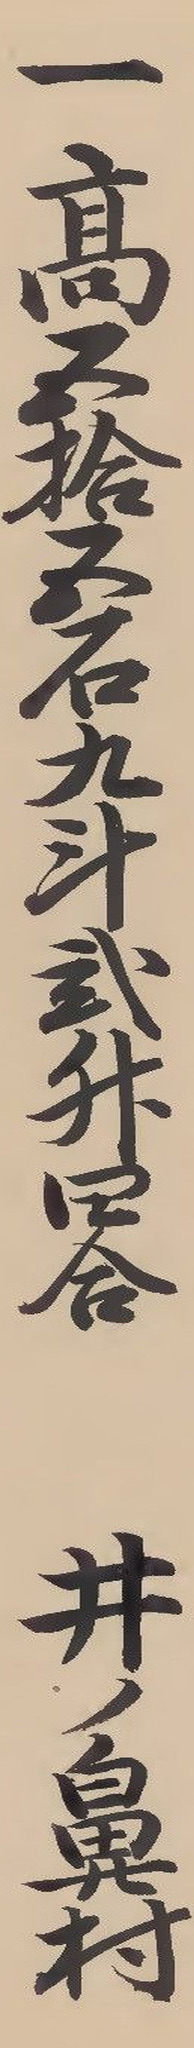一高五拾五石九斗弐升四合井ノ鼻村
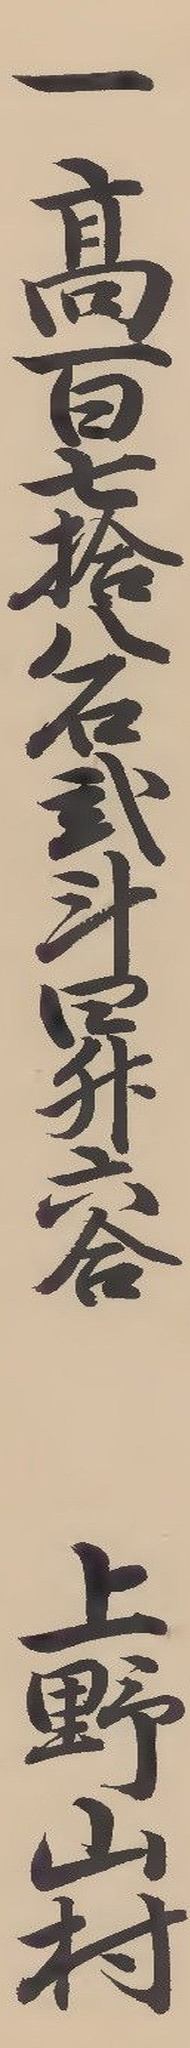一高百七拾八石弐斗四升六合上野山村

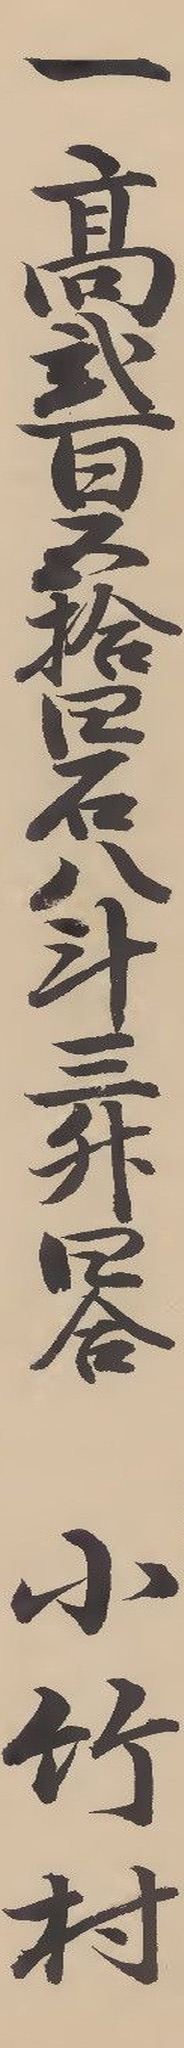一高弐百五拾四石八斗三升四合小竹村
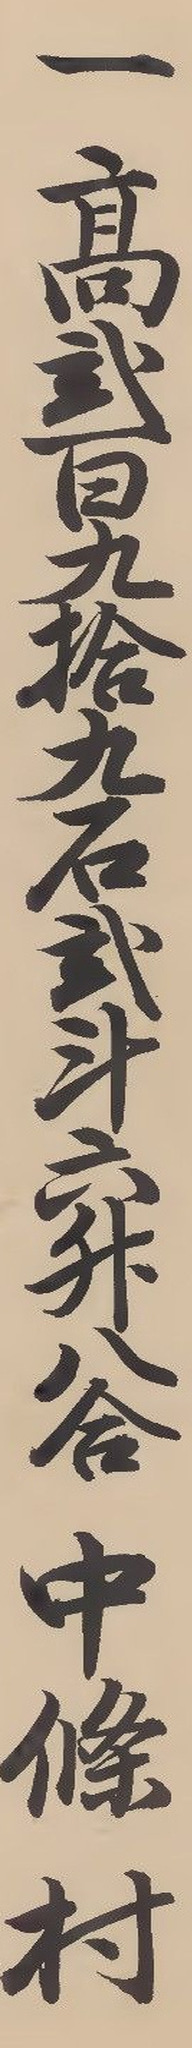一高弐百九拾九石弐斗六升八合中条村
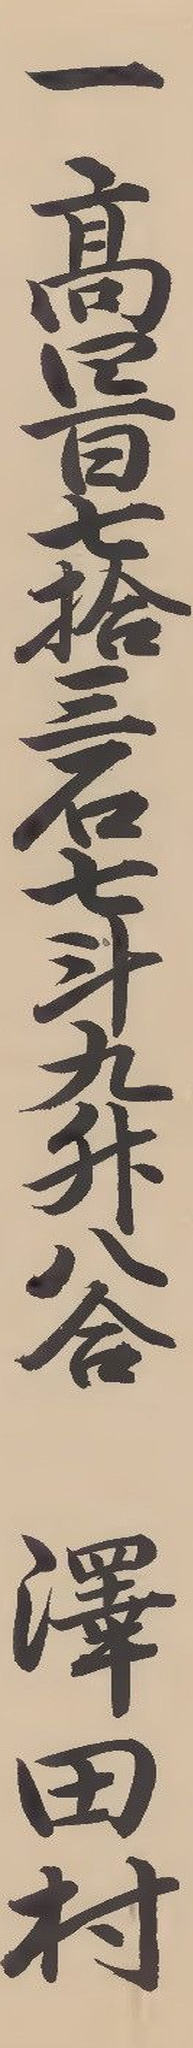一高四百七拾三石七斗九升八合沢田村
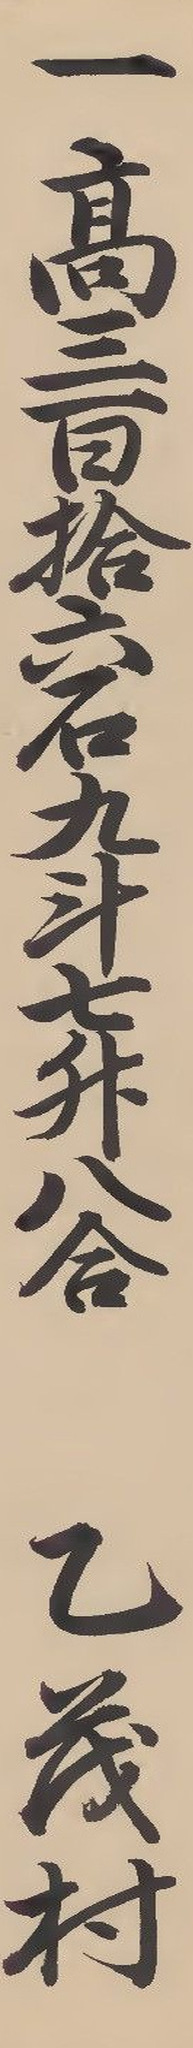一高三百拾六石九斗七升八合乙茂村
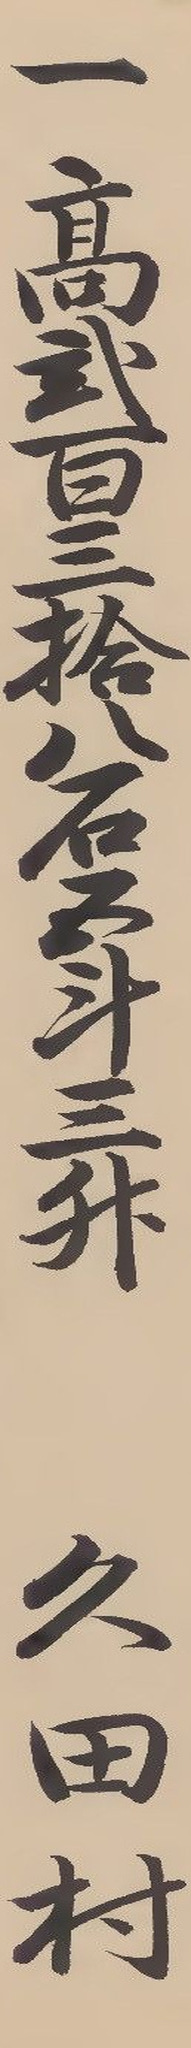一高弐百三拾八石五斗三升久田村
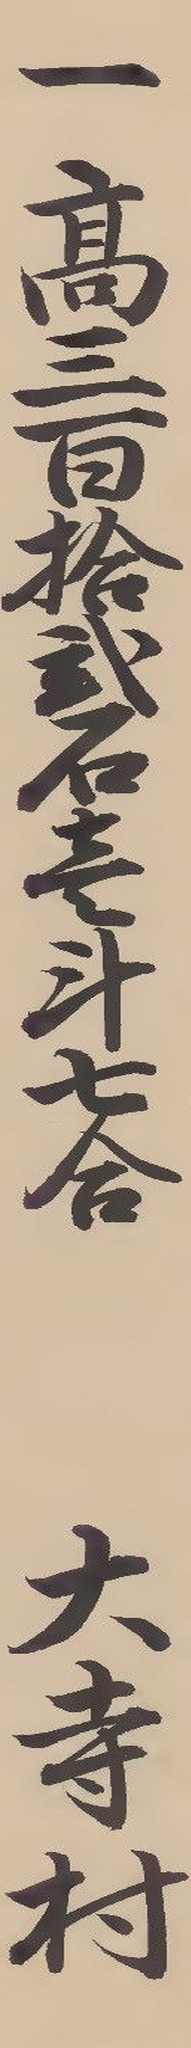一高三百拾弐石壱斗七合大寺村
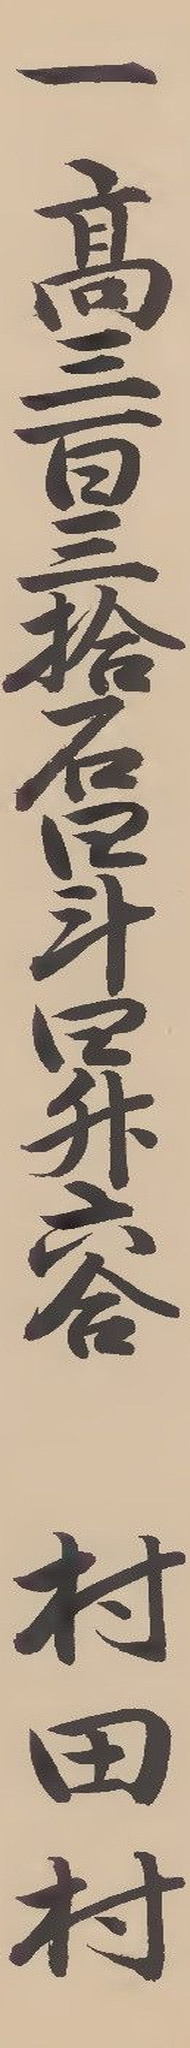一高三百三拾石四斗四升六合村田村
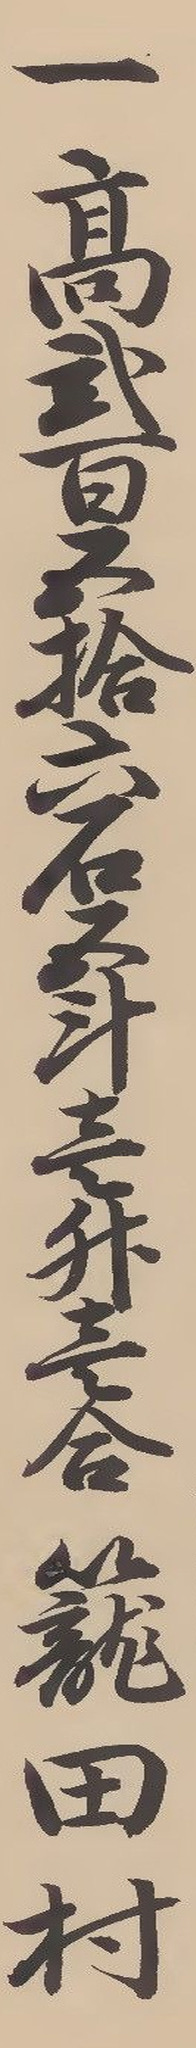一高弐百五拾六石五斗壱升壱合篭田村

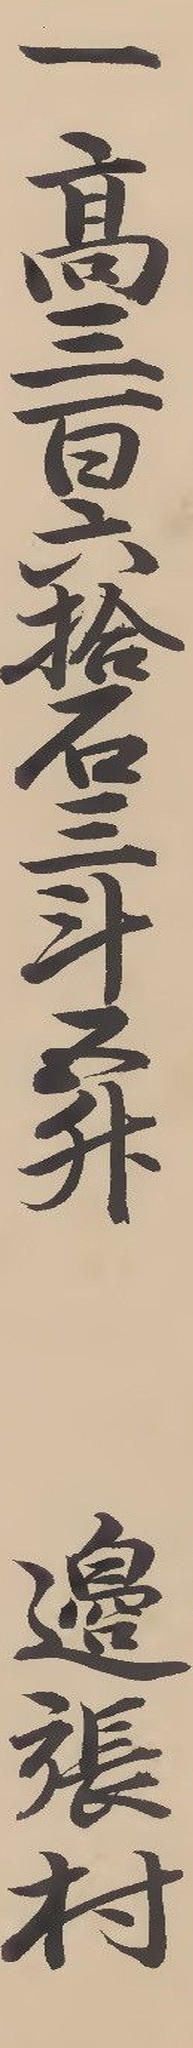一高三百六拾石三斗五升辺張村
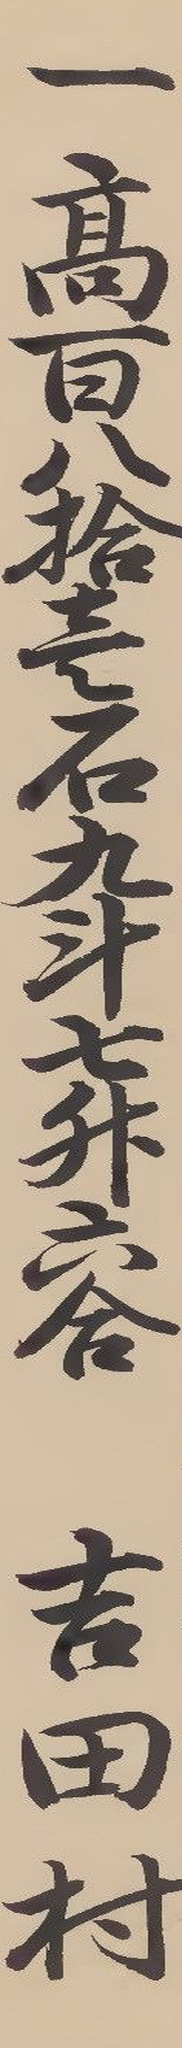一高百八拾壱石九斗七升六合吉田村
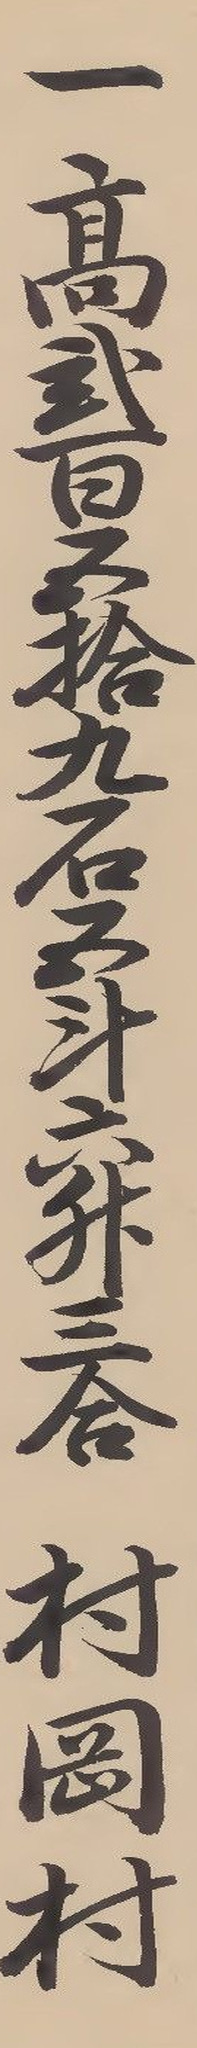一高弐百五拾九石五斗六升三合村岡村
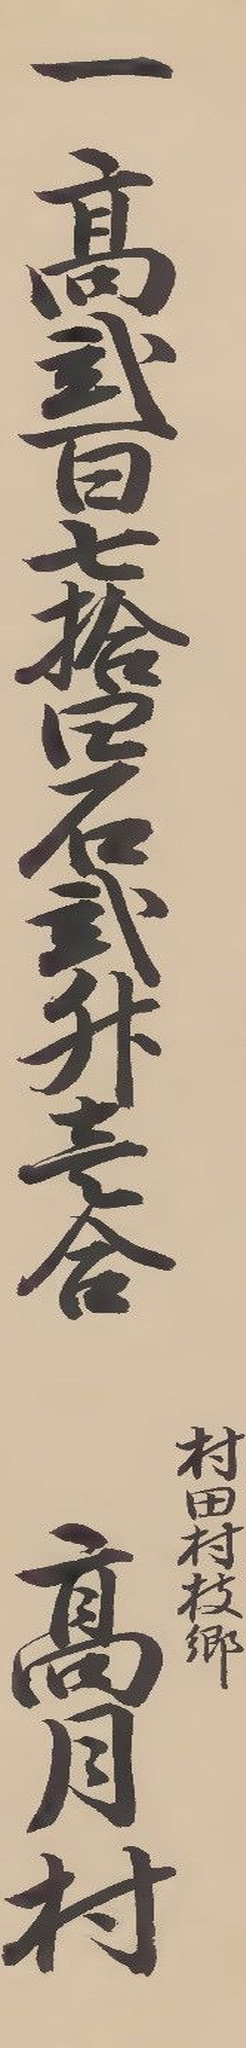一高弐百七拾四石弐升壱合高月村
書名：越後国郷帳　中
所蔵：国立公文書館 National Archives of Japan
